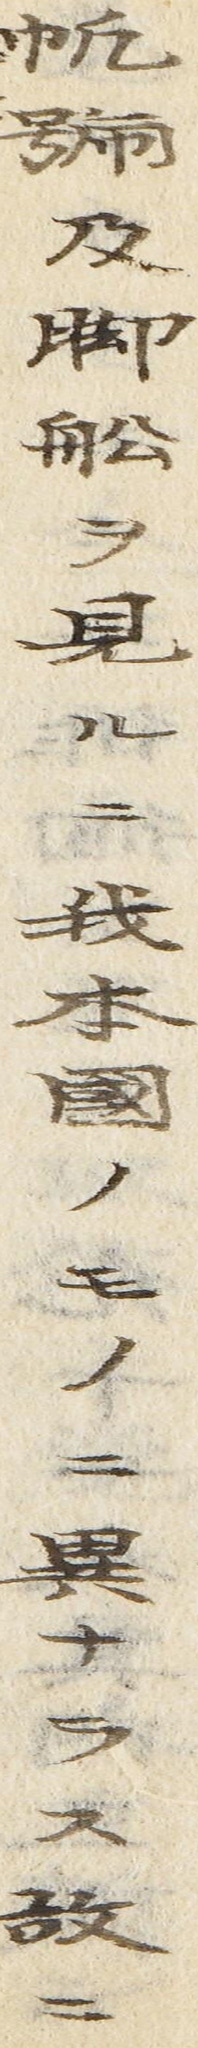帆号及脚船ヲ見ルニ我本国ノモノニ異ナラス故ニ
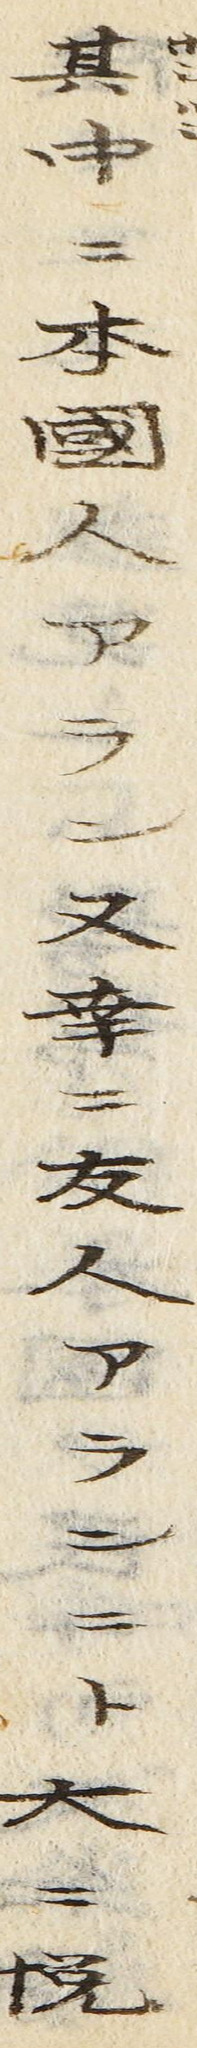其中ニ本国人アラン又幸ニ友人アランニト大ニ悦
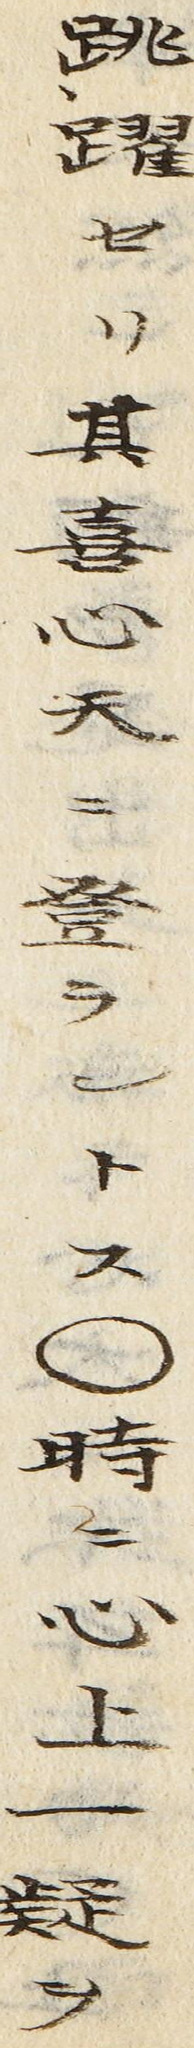跳躍セリ其喜心天ニ登ラントス◯時ニ心上一疑ヲ
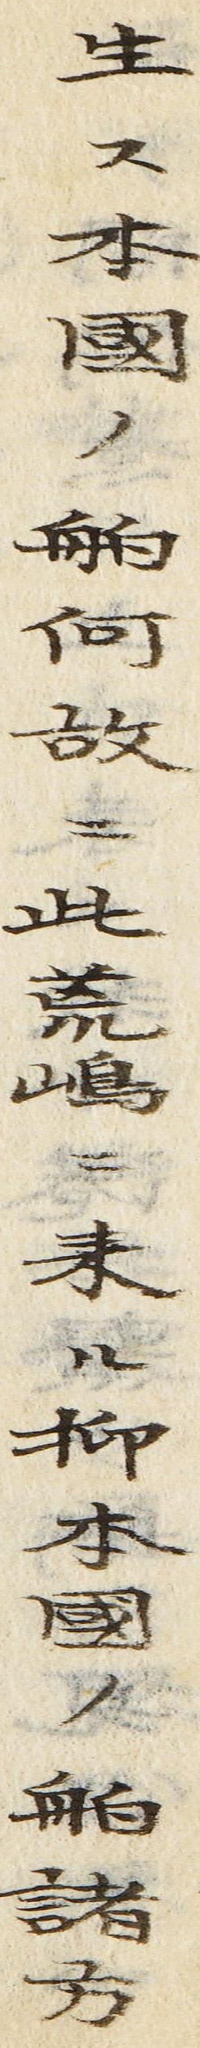生ス本国ノ舶何故ニ此荒嶋ニ来ル抑本国ノ舶諸方
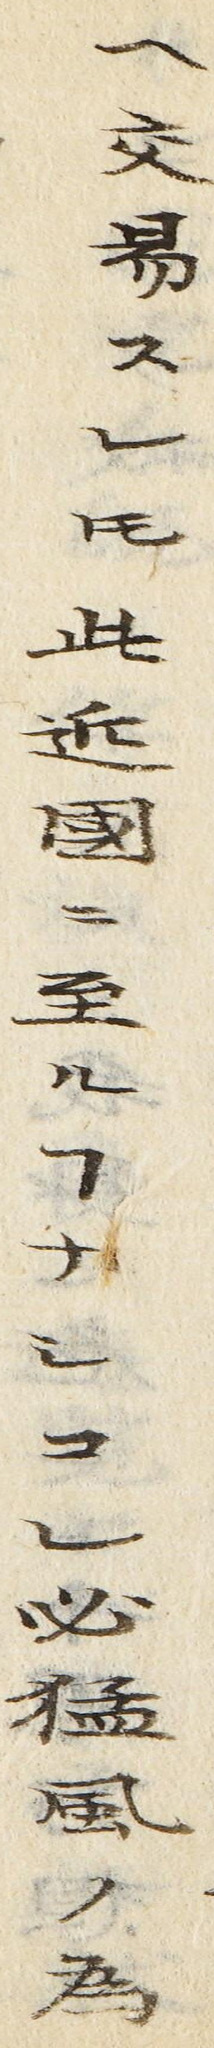ヘ交易スレトモ此近国ニ至ルコトナシコレ必猛風ノ為
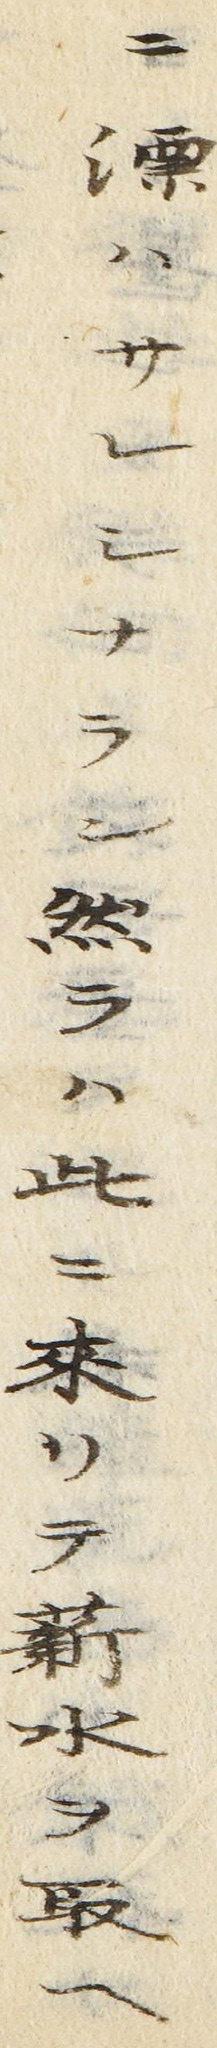ニ漂ハサレシナラン然ラハ此ニ来リテ薪水ヲ取ヘ
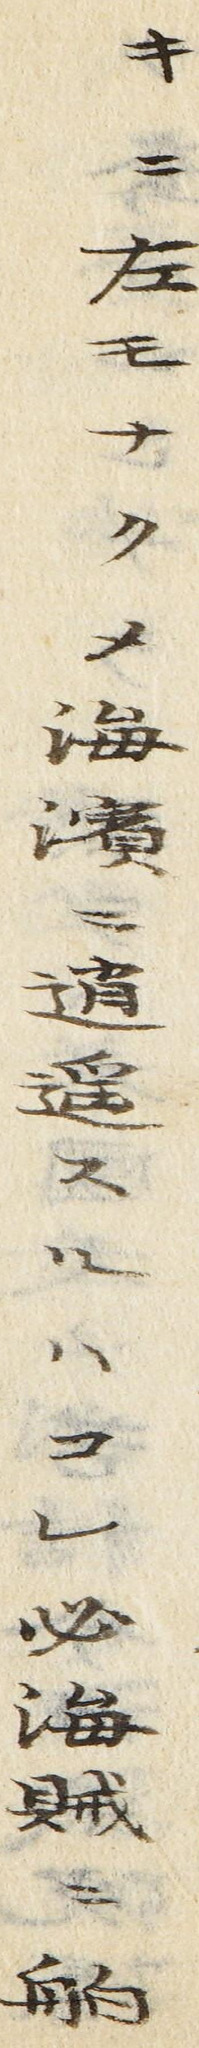キニ左モナクシテ海浜ニ逍遥スルハコレ必海賊ニ舶

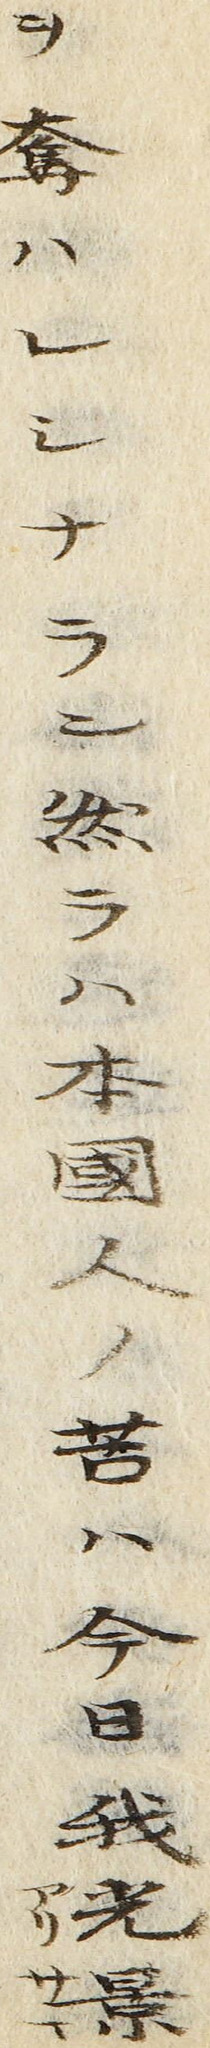ヲ奪ハレシナラン然ラハ本国人ノ苦ハ今日我光景
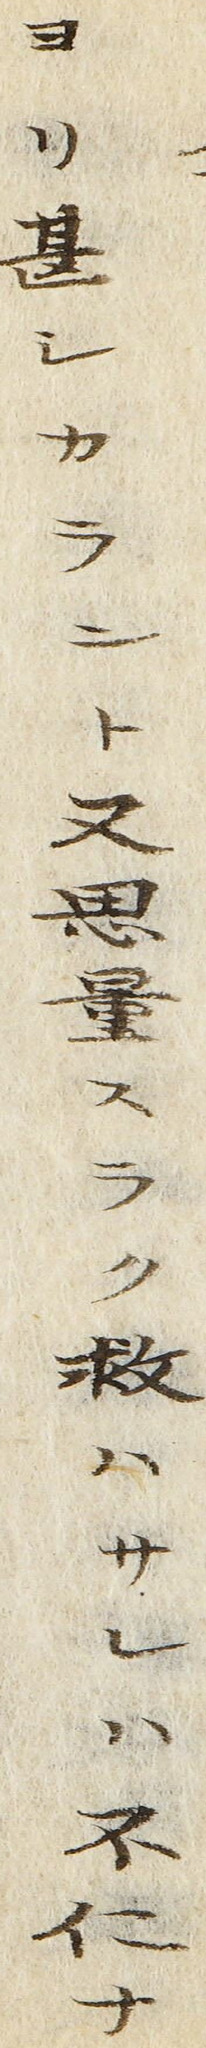ヨリ甚シカラント又思量スラク救ハサレハ不仁ナ
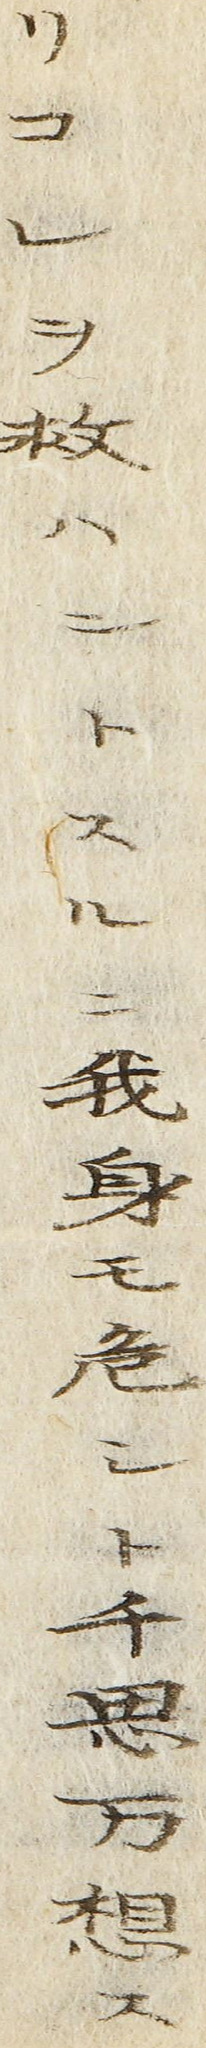リコレヲ救ハントスルニ我身モ危シト千思万想ス
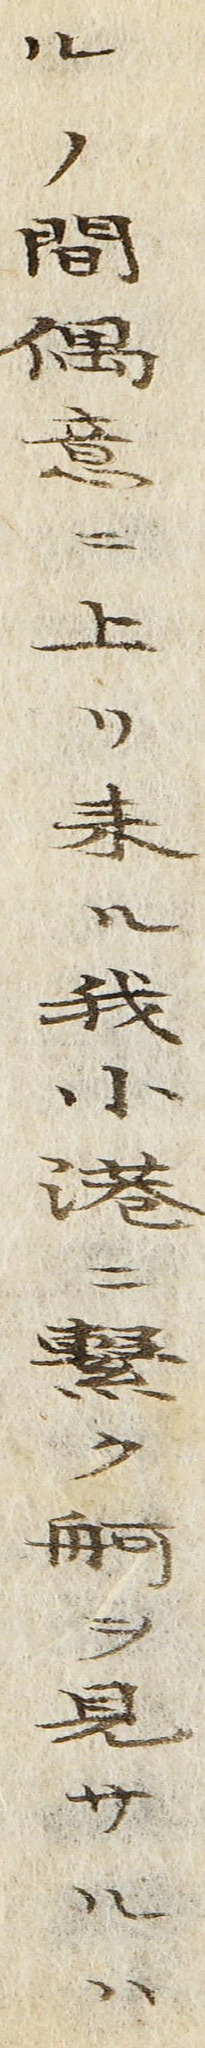ルノ間偶意ニ上リ来ル我小港ニ繋ク舸ヲ見サルハ
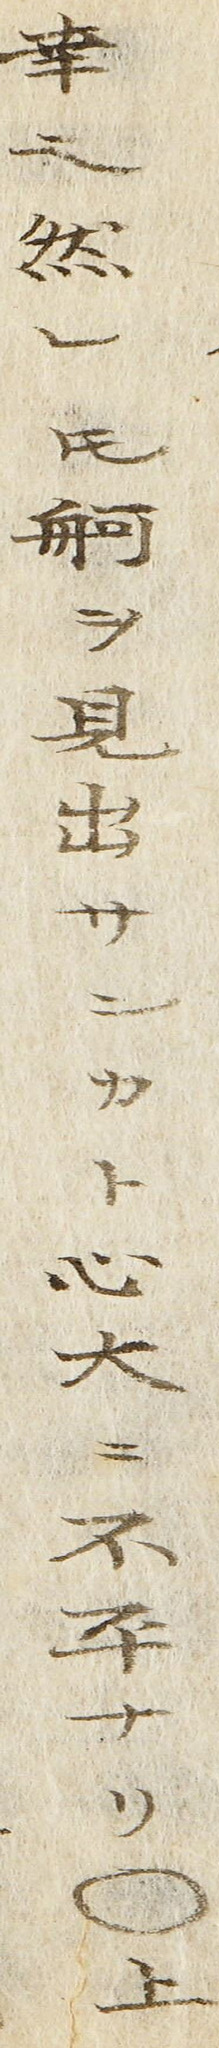幸也然レトモ舸ヲ見出サンカト心大ニ不平ナリ◯上
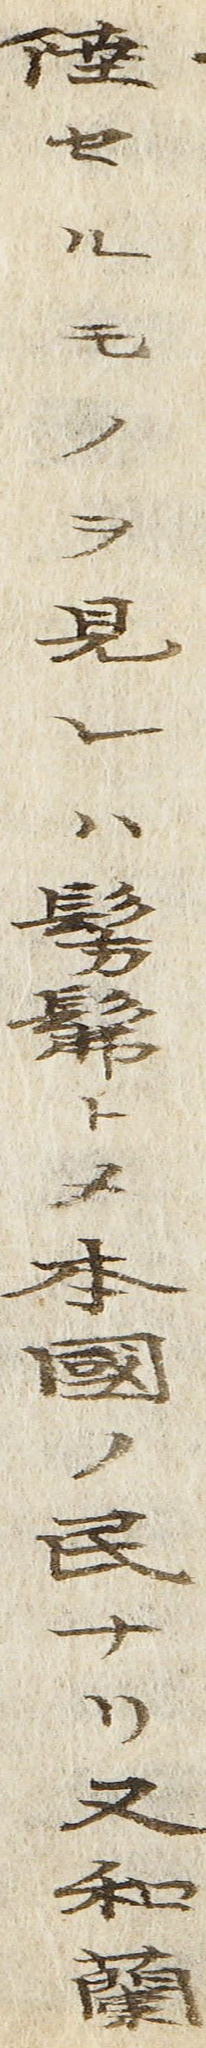陸セルモノヲ見レハ髣髴トシテ本国ノ民ナリ又和蘭
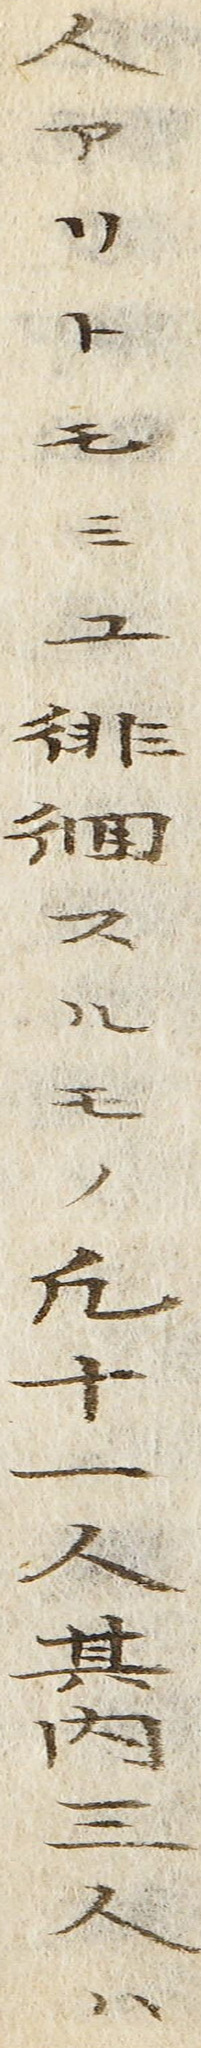人アリトモミユ徘徊スルモノ凡十一人其内三人ハ
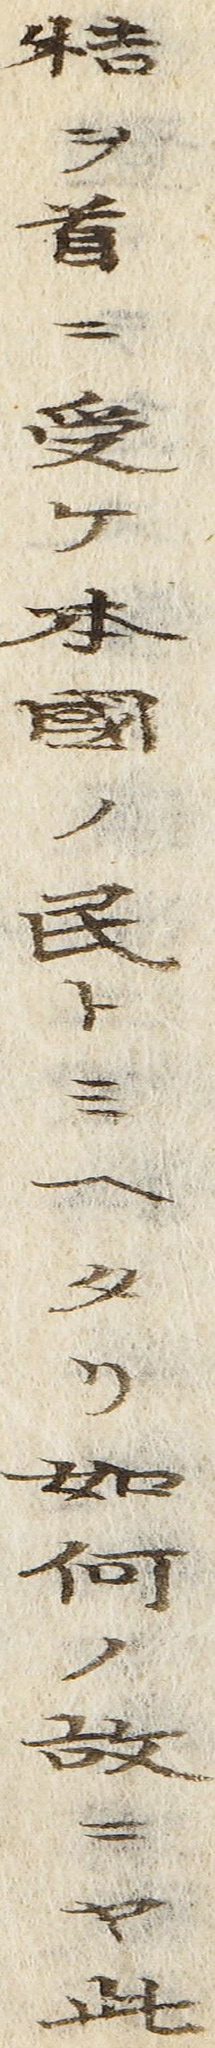梏ヲ首ニ受ケ本国ノ民トミヘタリ如何ノ故ニヤ此
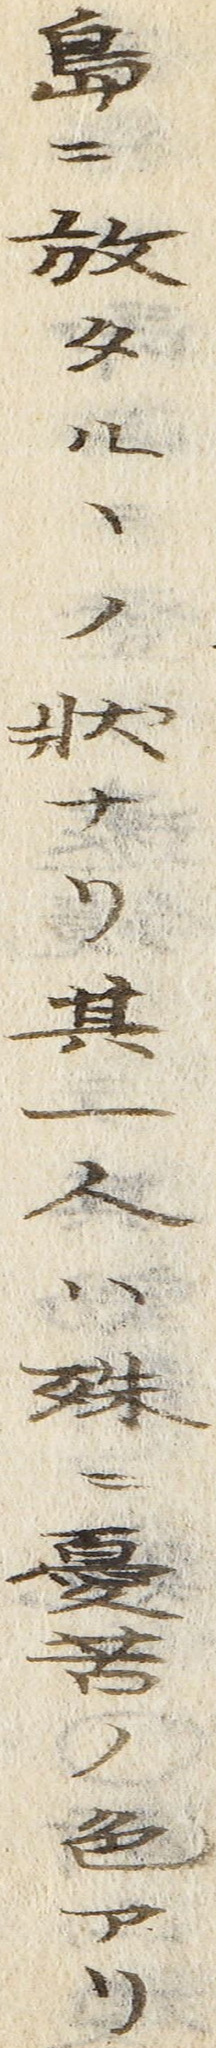島ニ放タルヽノ状ナリ其一人ハ殊ニ憂苦ノ色アリ
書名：漂流紀事
